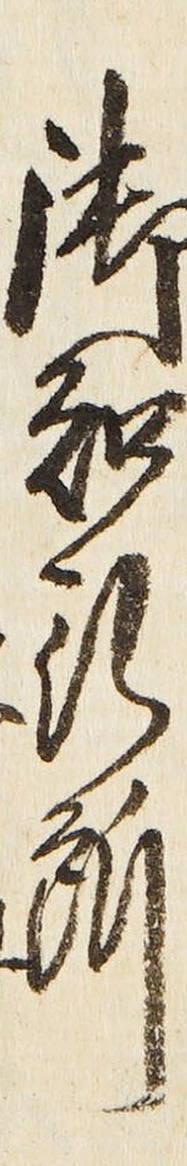御知行所
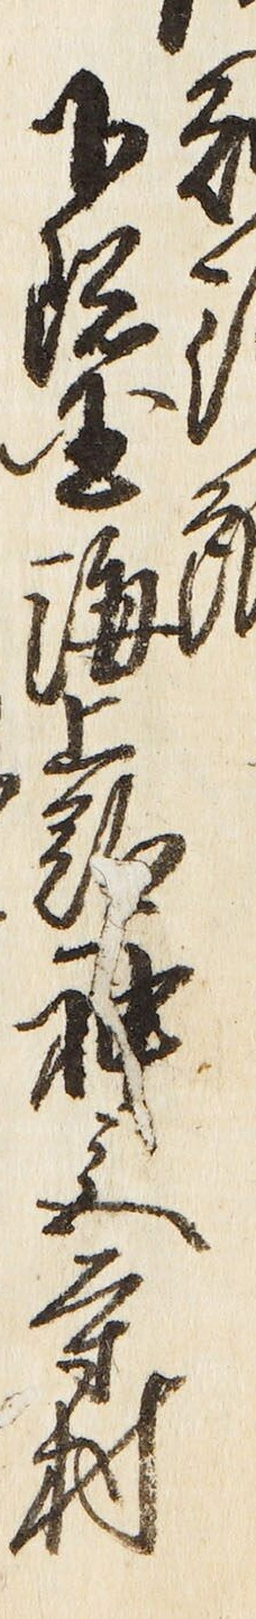下総国海上郡神宮寺村
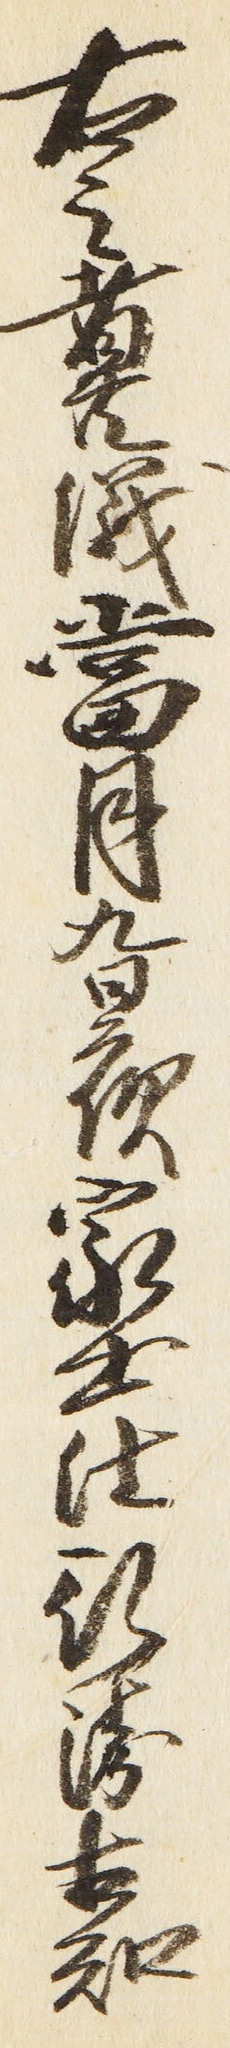右之者共儀当月九日夜家出仕行衛相知
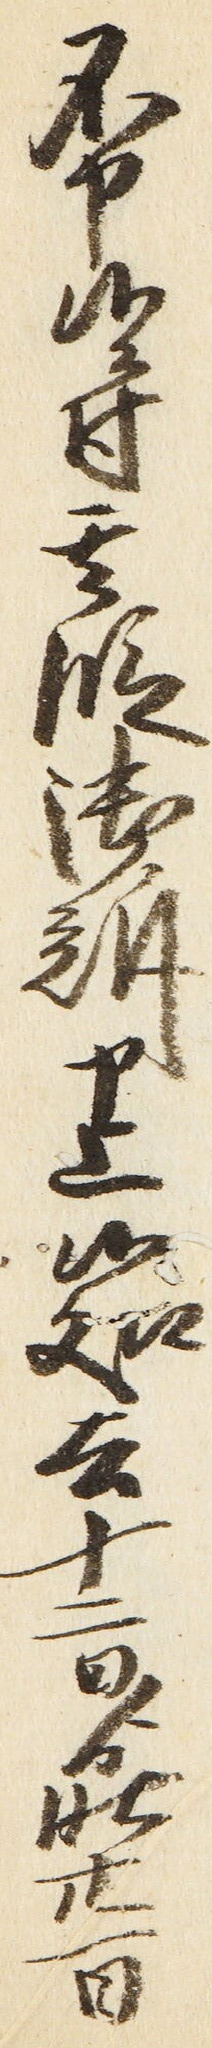不申候ニ付其段御訴申上候処去十二日ゟ昨廿一日

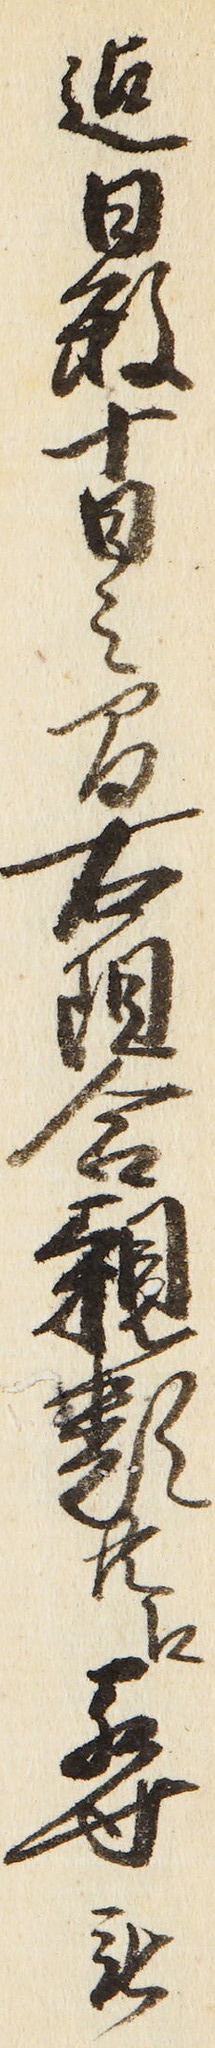迄日数十日之間右組合親類共江尋被
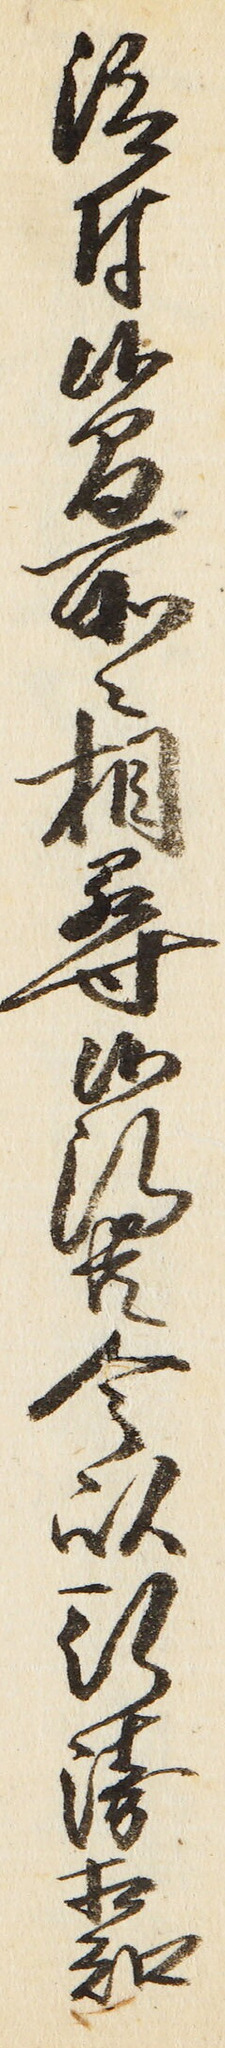仰付候間所々相尋候得共今以行衛相知
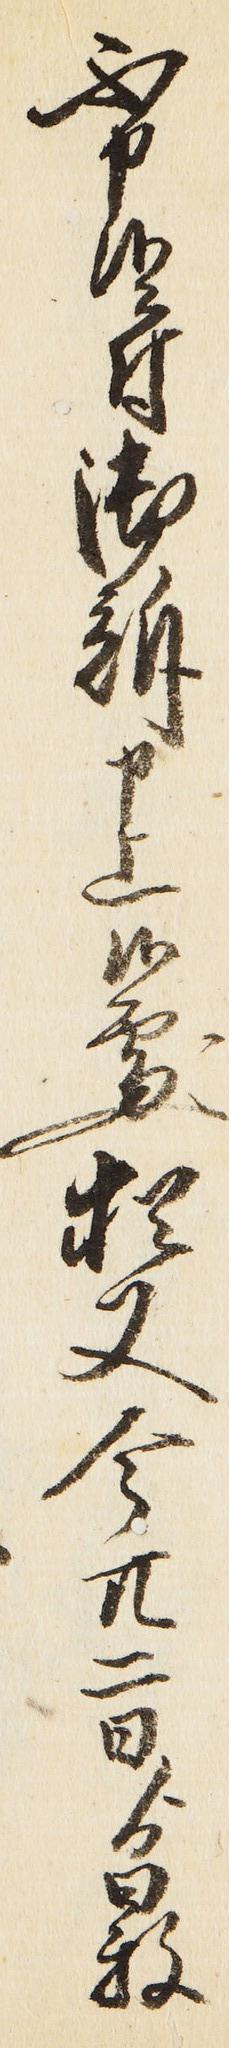不申候ニ付御訴申上候処猶又今廿二日ゟ日数
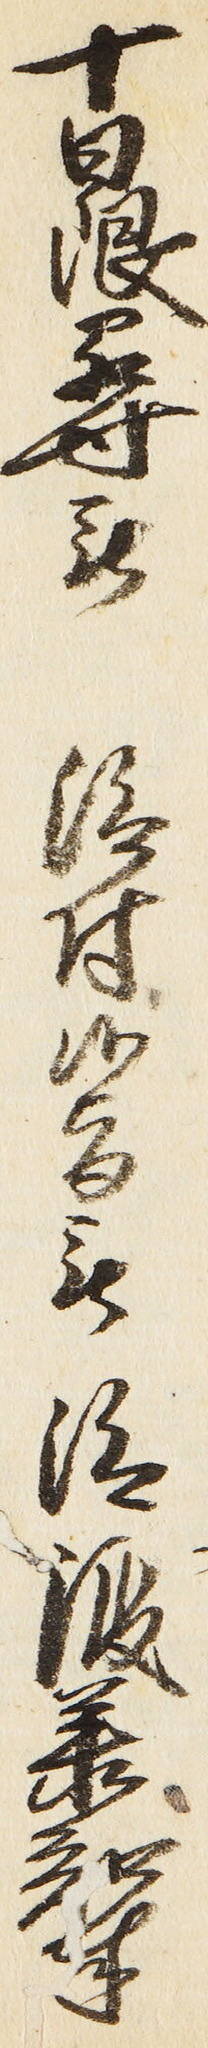十日限尋被仰付候旨被仰渡承知奉
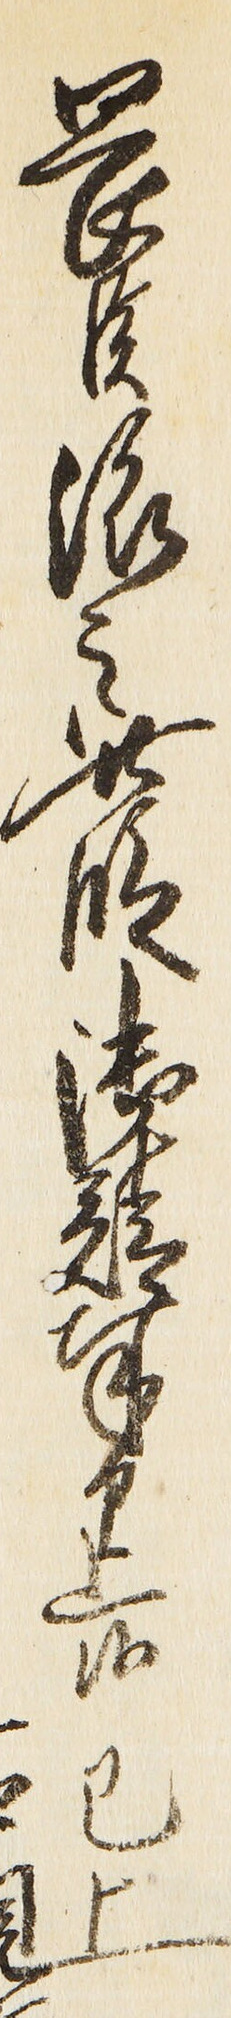畏候依之此段御請奉申上候已上
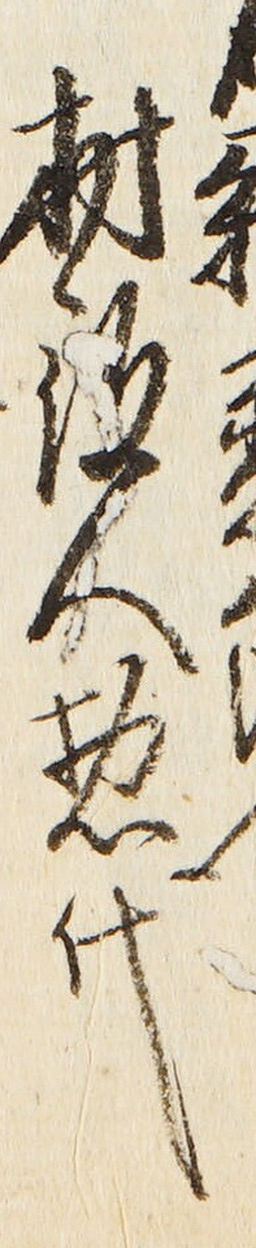村役人惣代
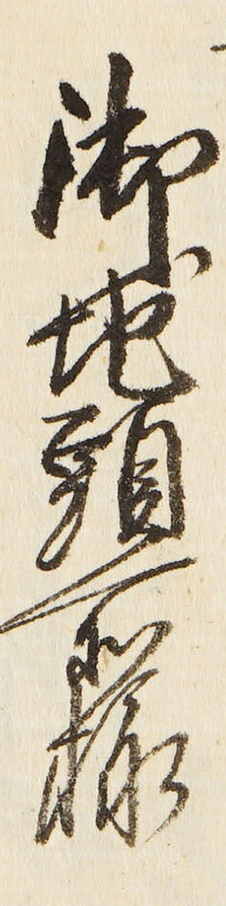御地頭所様
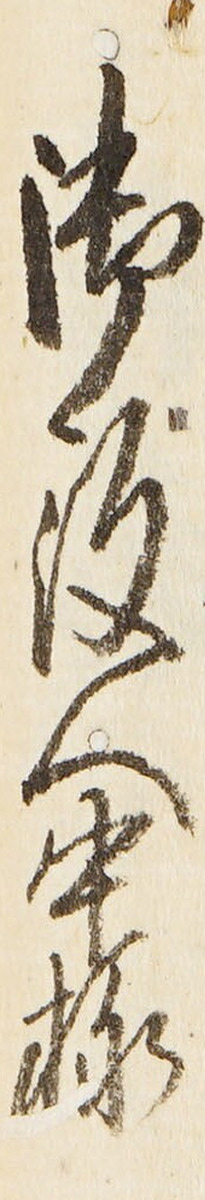御役人中様
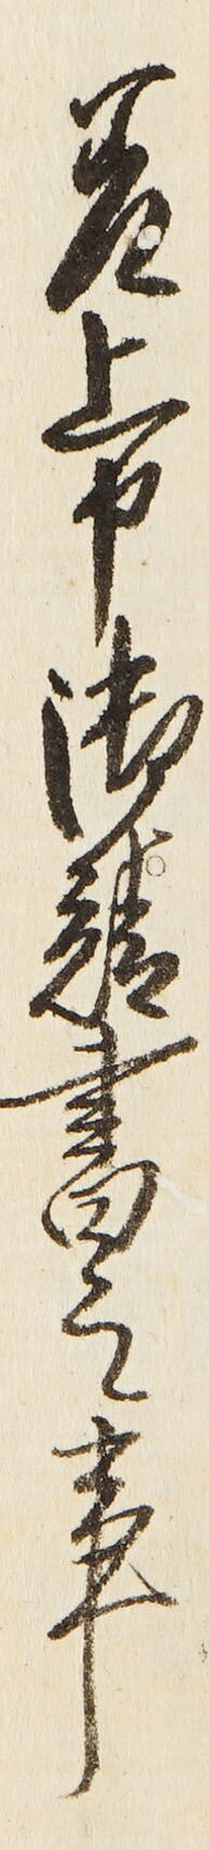差上申御請書之事
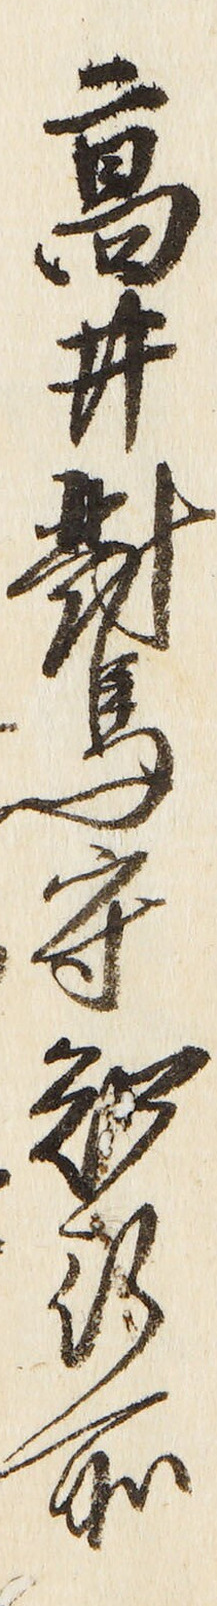高井対馬守知行所
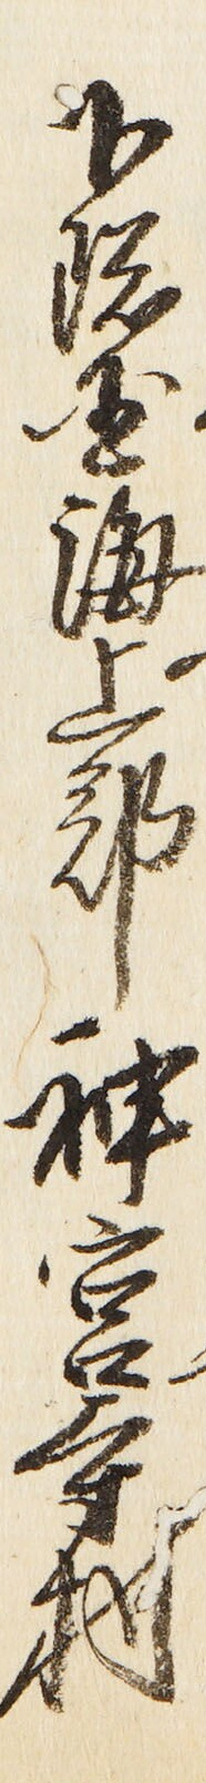下総国海上郡神宮寺村
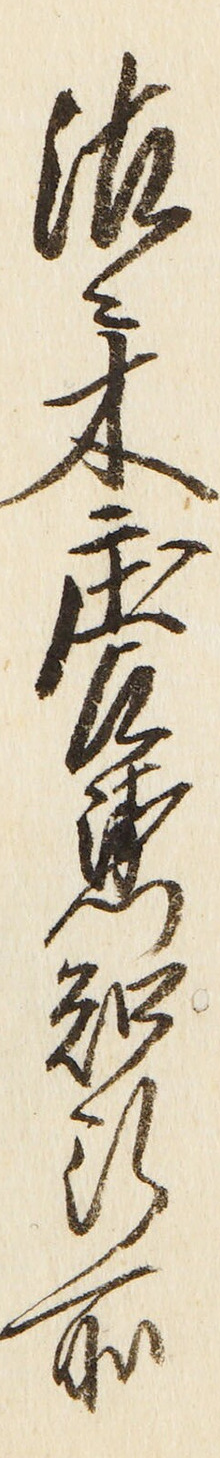佐々木庄左衛門知行所
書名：難船一件記録
